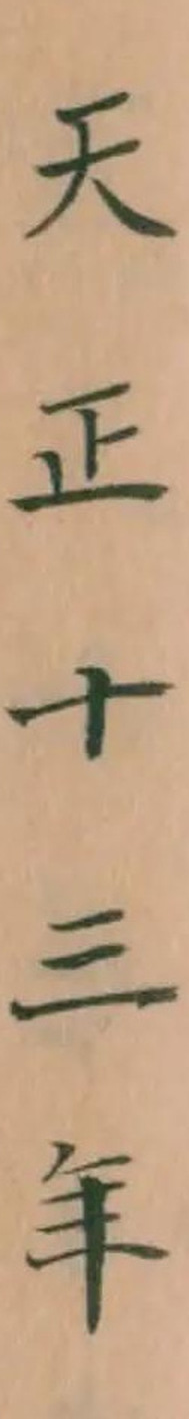天正十三年
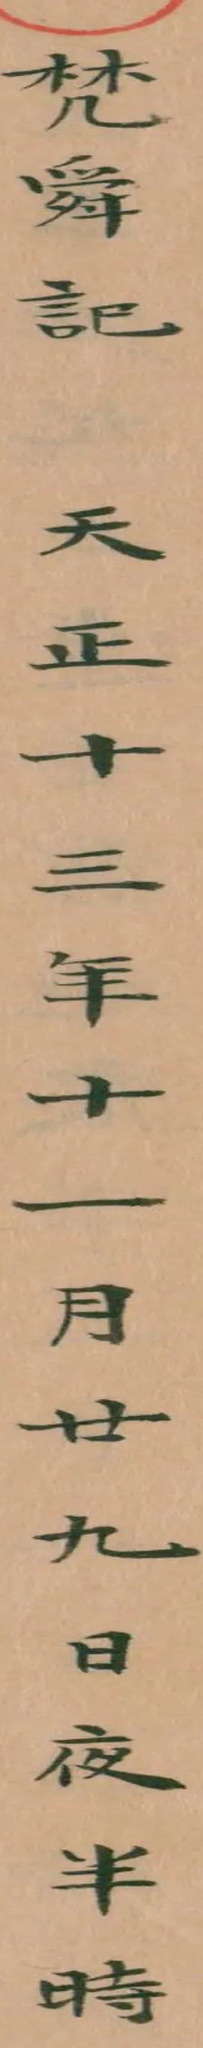○梵舜記天正十三年十一月廿九日夜半時
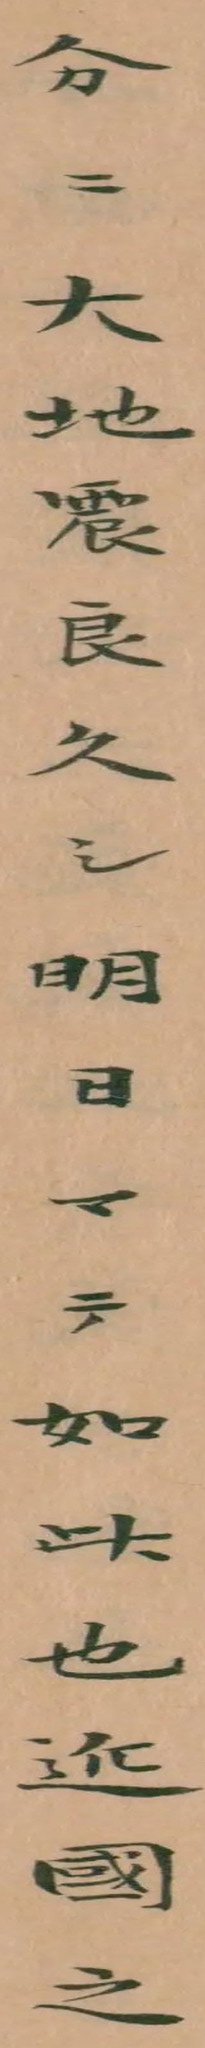分ニ大地震良久シ明日マテ如此也近国之
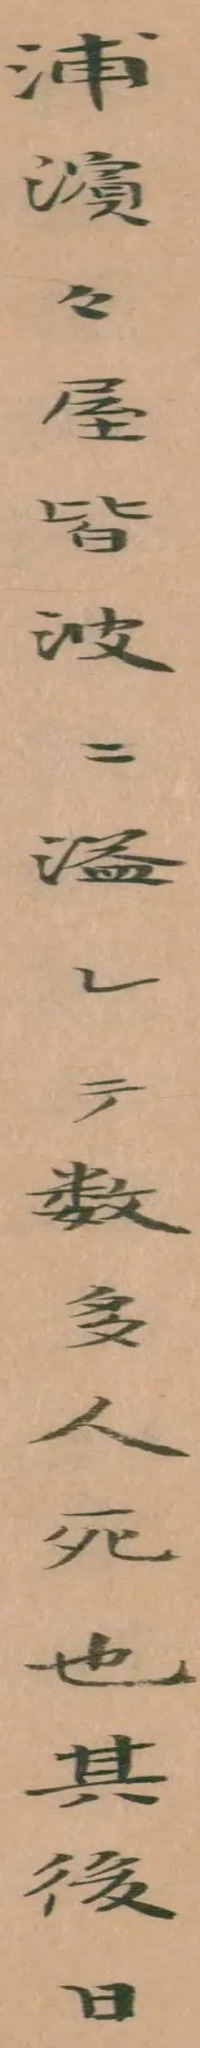浦浜々屋皆波ニ溢レテ数多死人也其後日
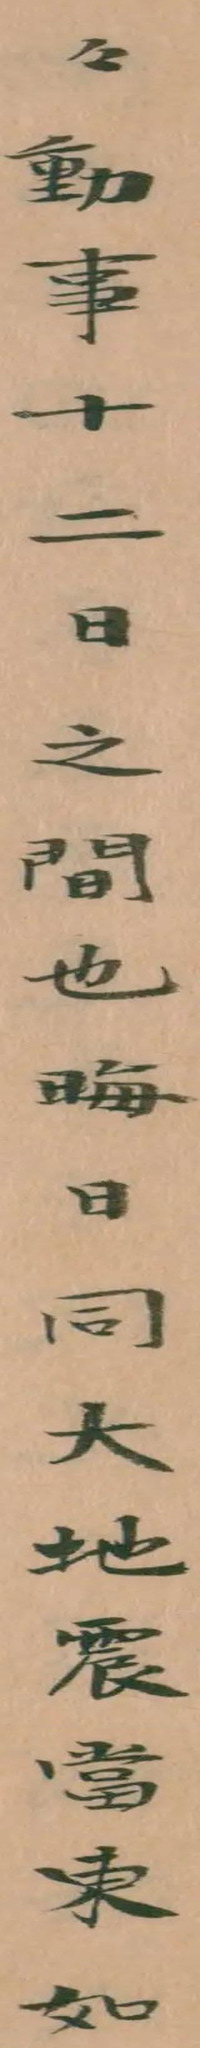々動事十二日之間也晦日同大地震当東如
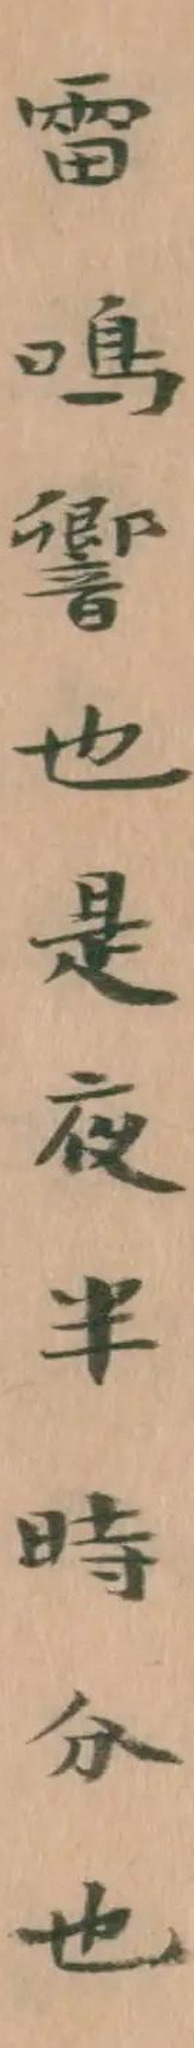雷鳴響也是夜半時分也
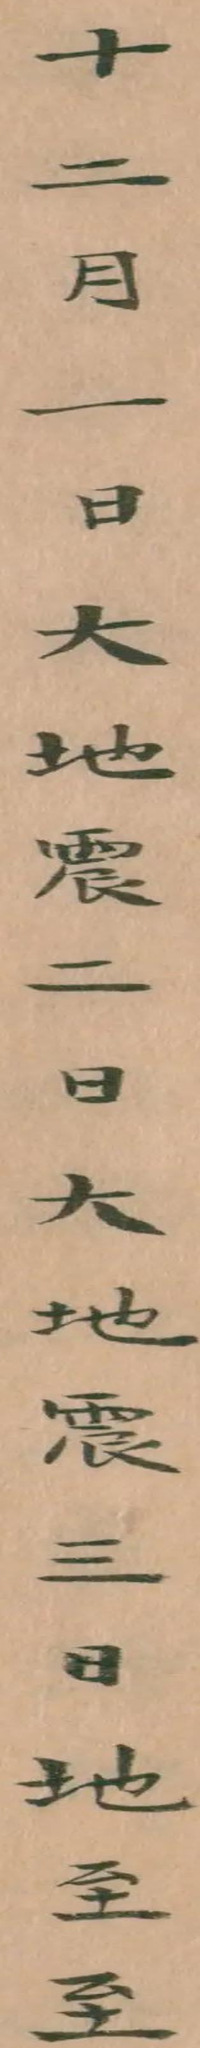十二月一日大地震二日大地震三日地至至
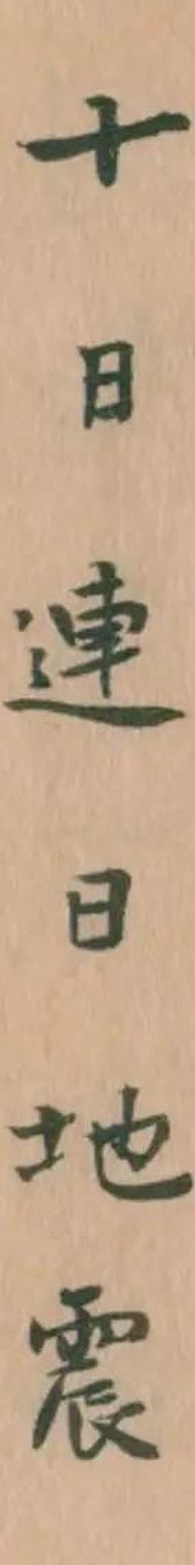十日連日地震
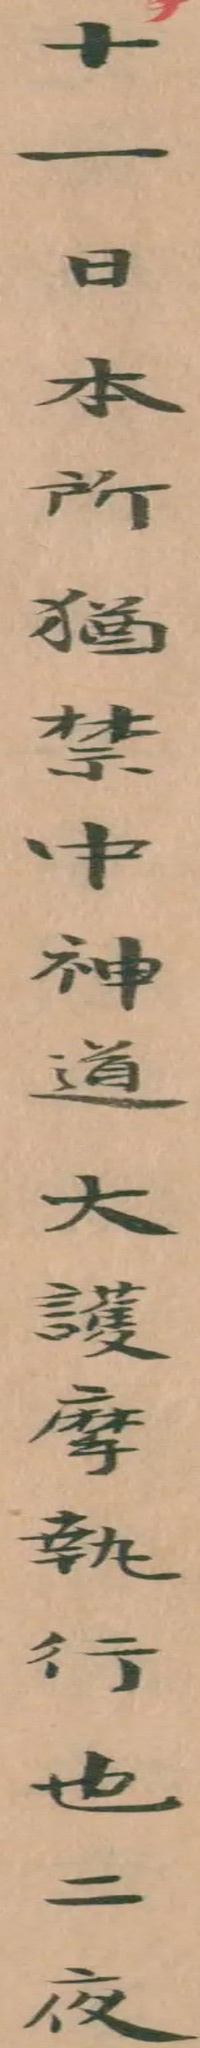十一日本所猶禁中神道大護摩執行也二夜
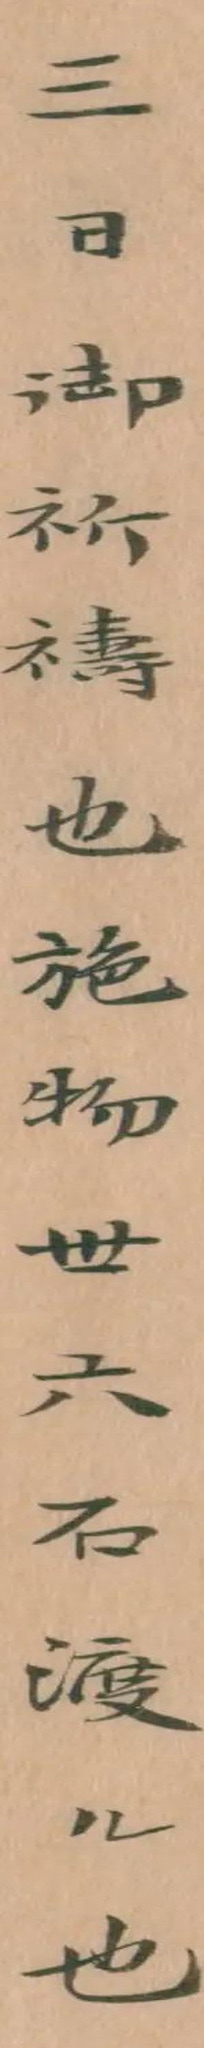三日御祈祷也施物卅六石渡ル也

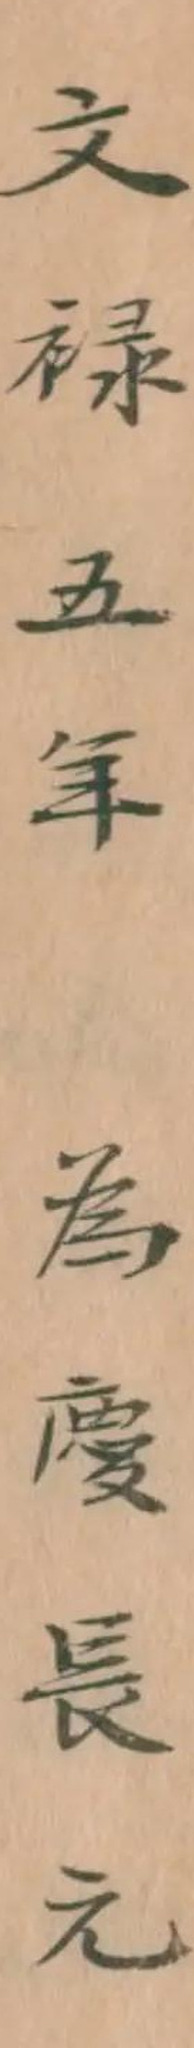文禄五年為慶長元
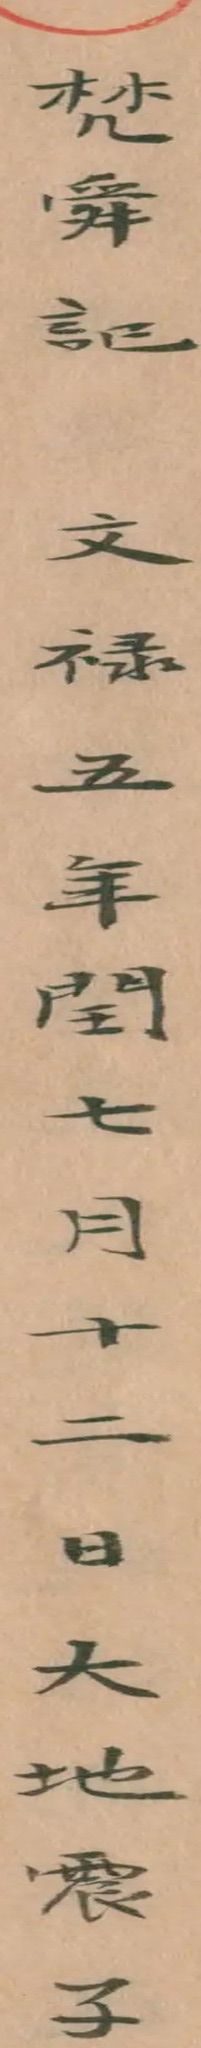○梵舜記文禄五年閏七月十二日大地震子
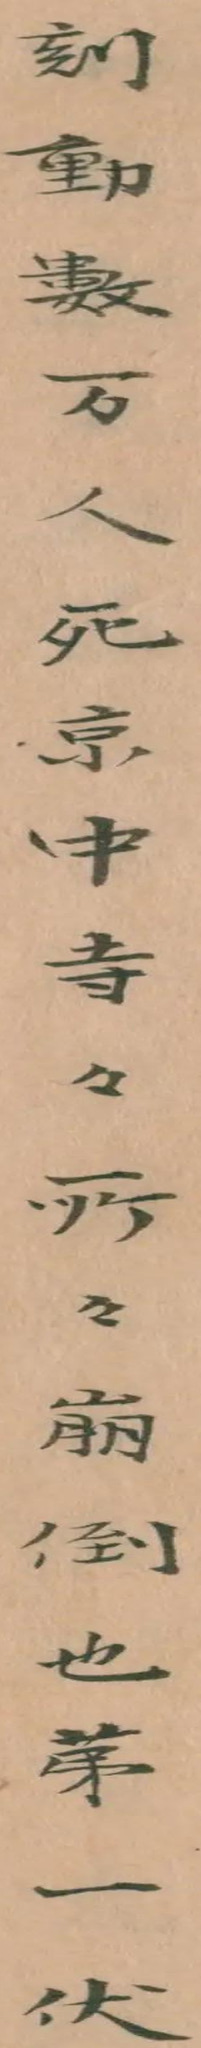刻動数万人死京中寺々所々崩倒也第一伏
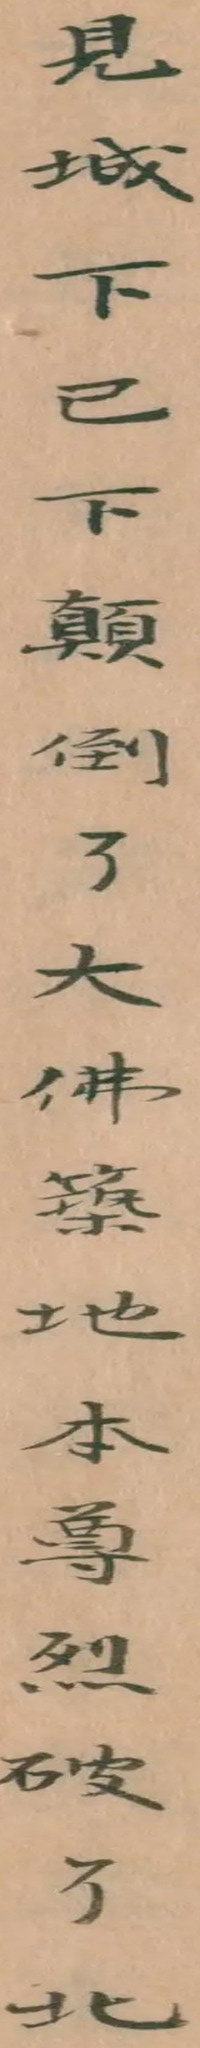見城下已下顛倒了大仏築地本尊烈破了北
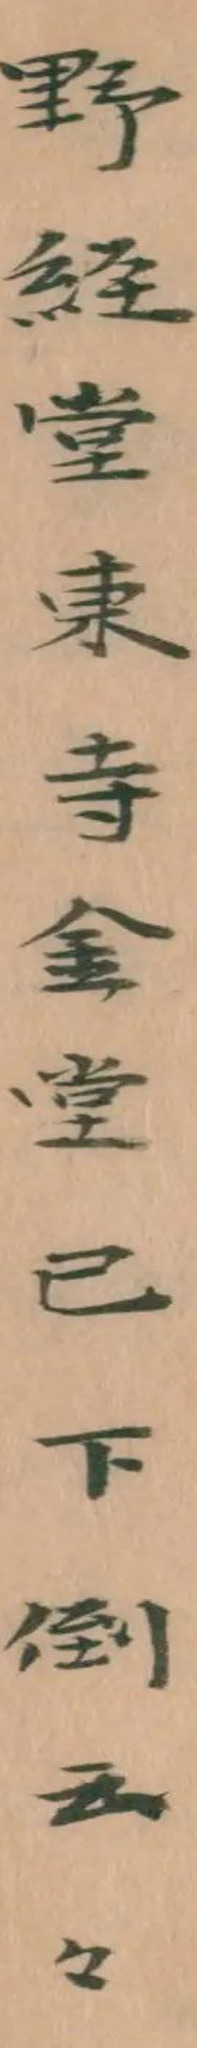野経堂東寺金堂已下倒云々
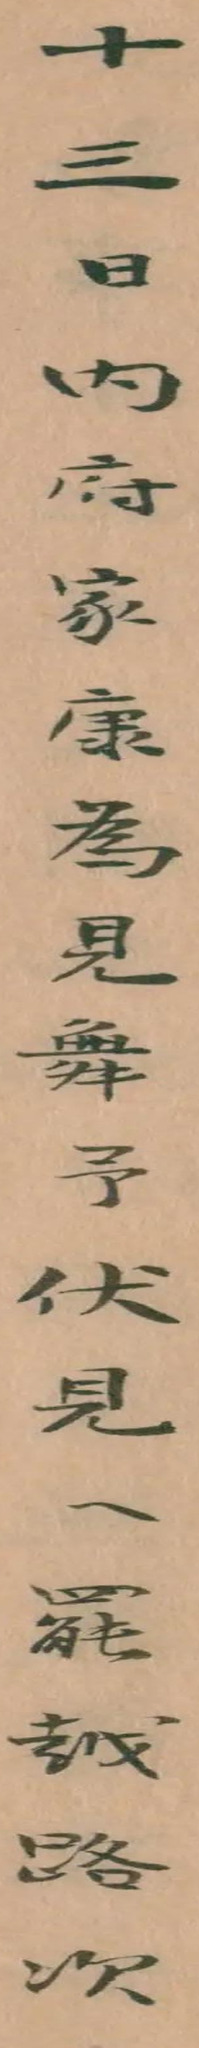十三日内府家康為見舞予伏見ヘ罷越路次
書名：地災撮要. 巻5-6(地震之部)
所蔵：国立国会図書館 National Diet Library, JAPAN
